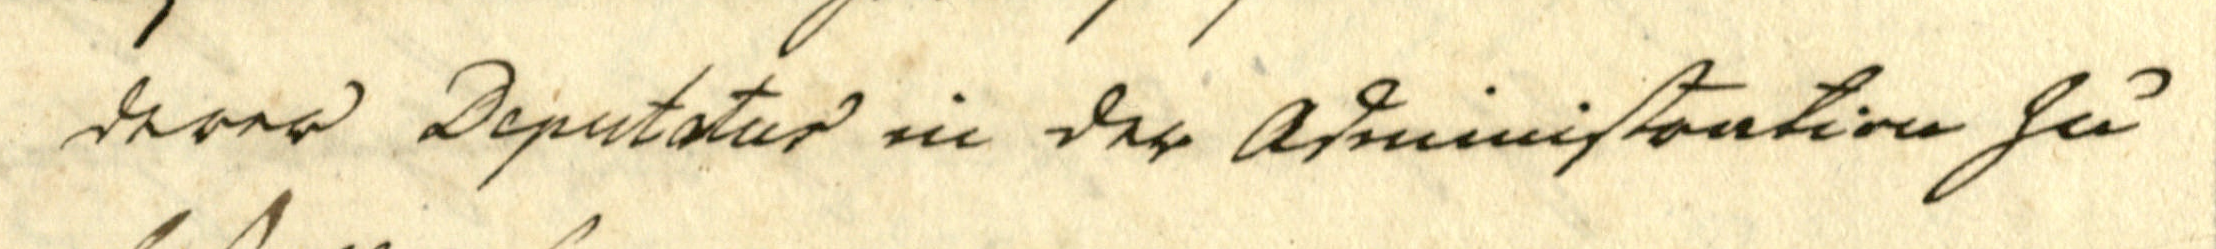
derer Deputatus in der Administration zu
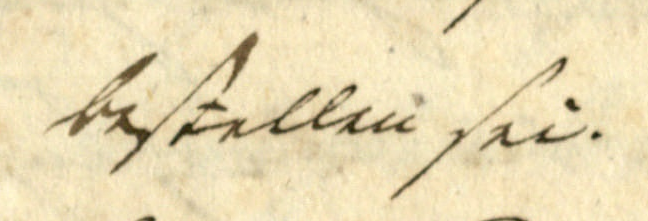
bestellen sei.
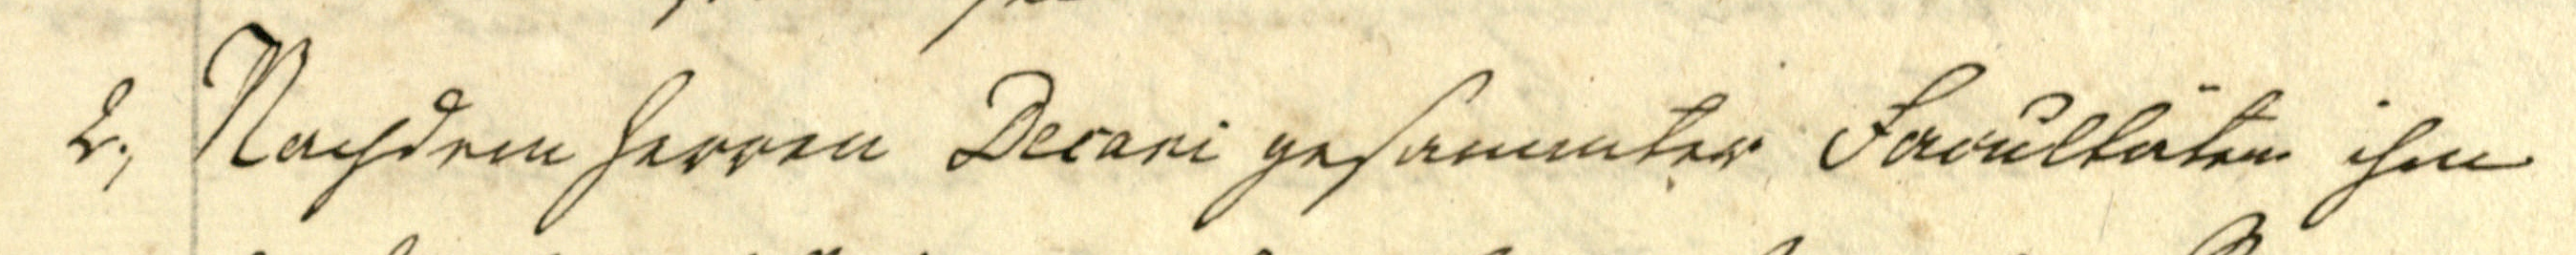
2. Nachdem Herren Decani gesammter Facultäten ihm
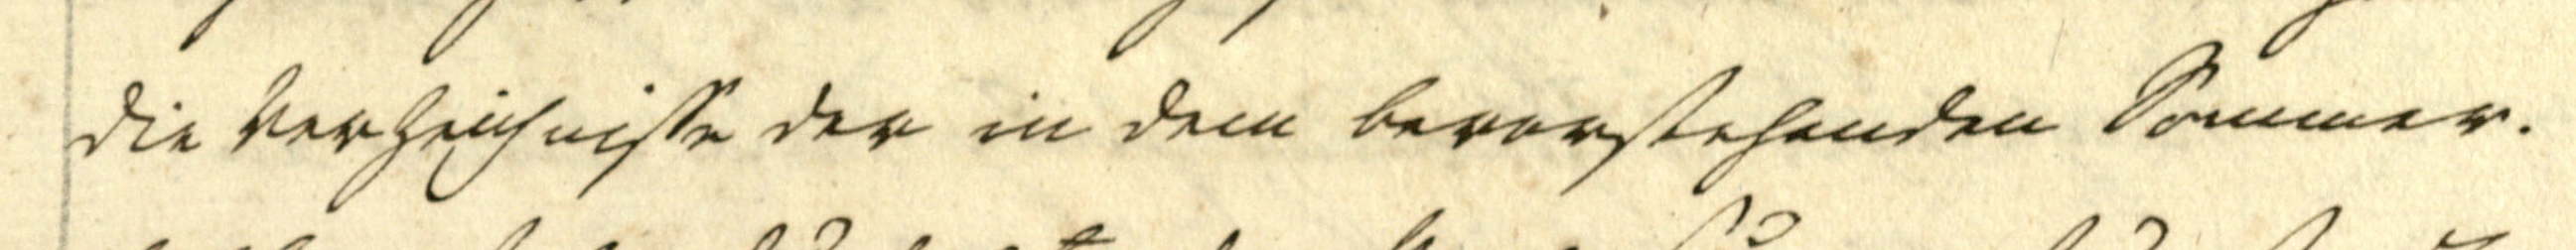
die Verzeichnisse der in dem bevorstehenden Sommer¬
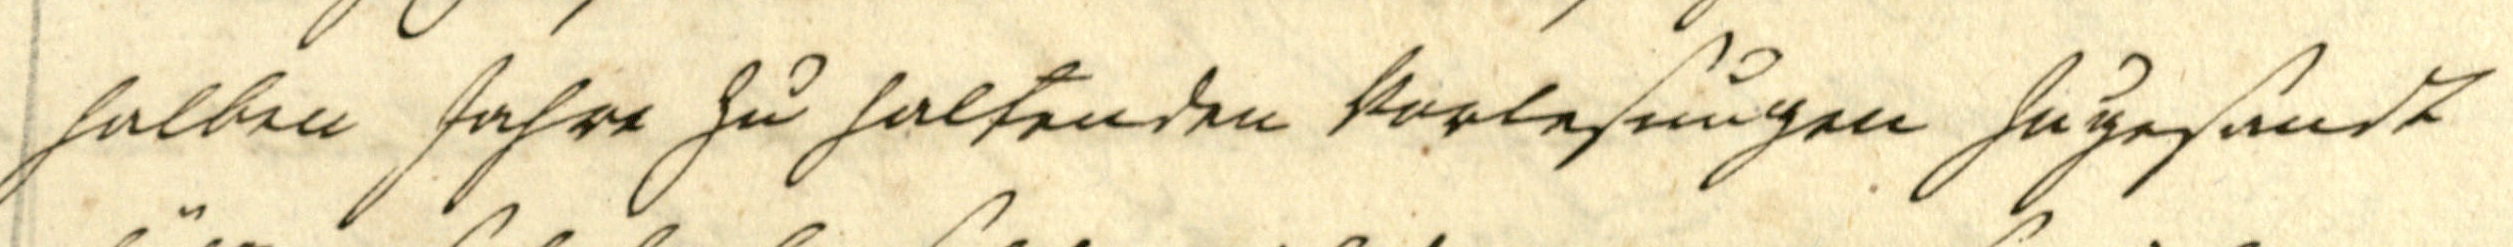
halben Jahre zu haltenden Vorlesungen zugesandt
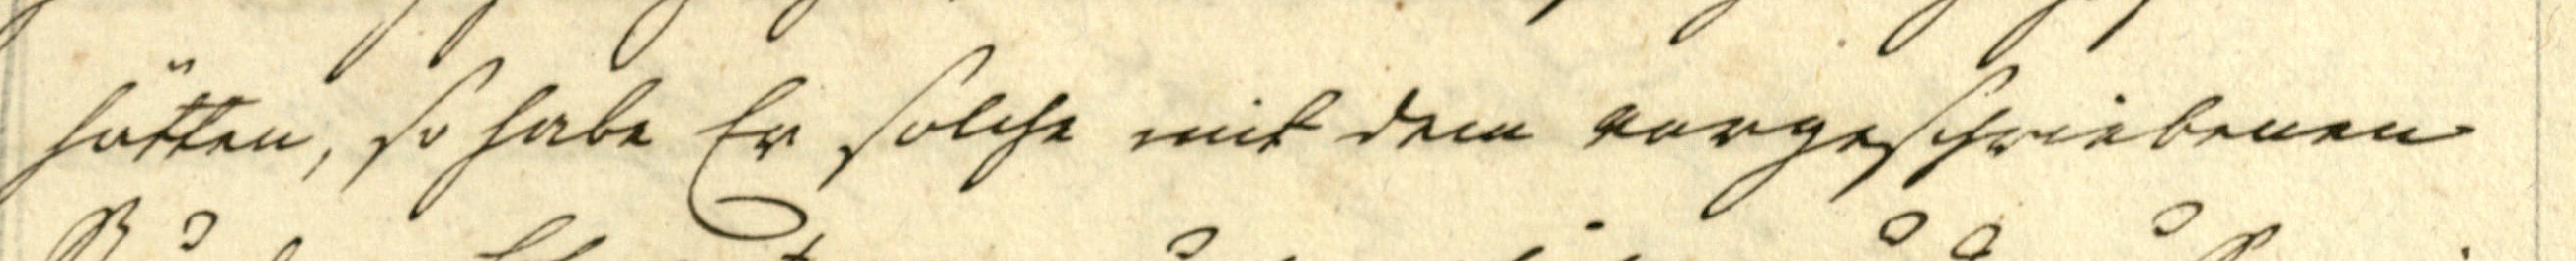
hätten, so habe Er solche mit dem vorgeschriebenen
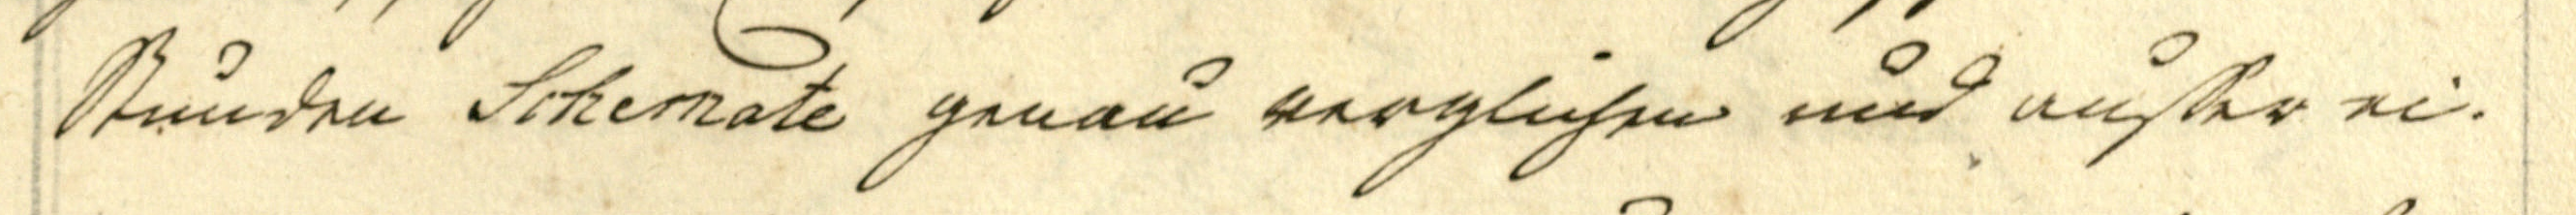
Stunden Schemate genau verglichen und ausser ei¬
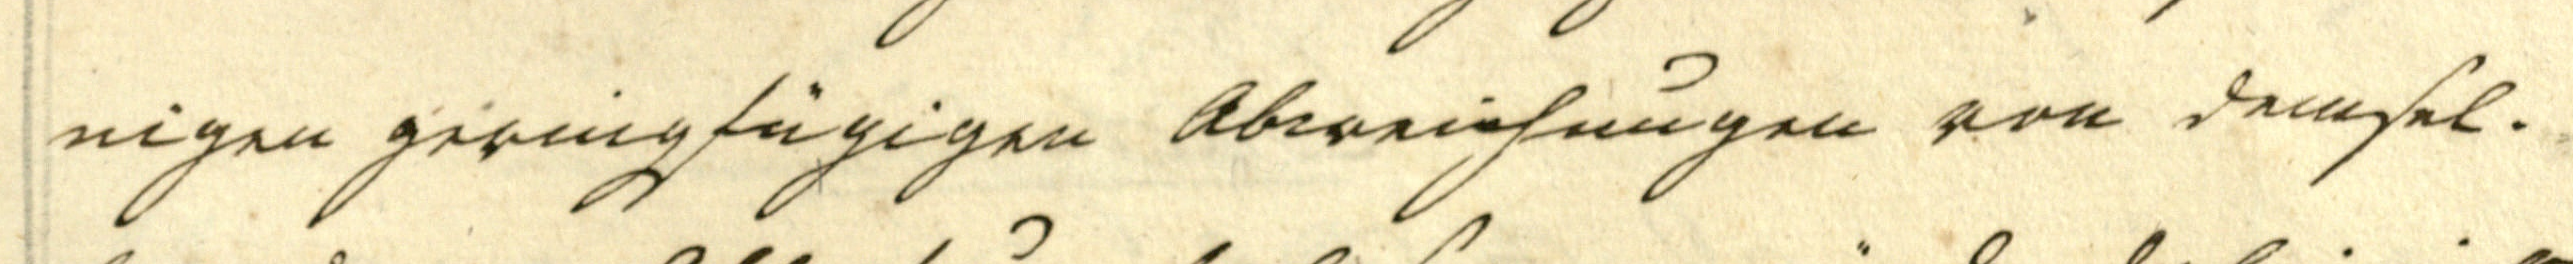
nigen geringfügigen Abweichungen von demsel¬
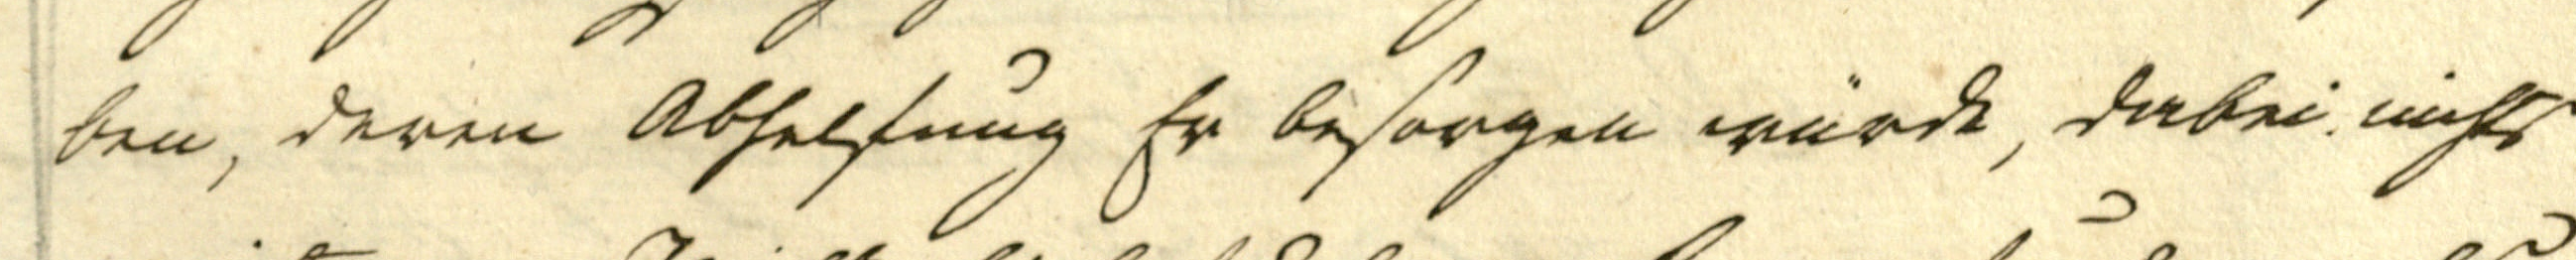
ben, deren Abhelfung Er besorgen würde, dabei nichts
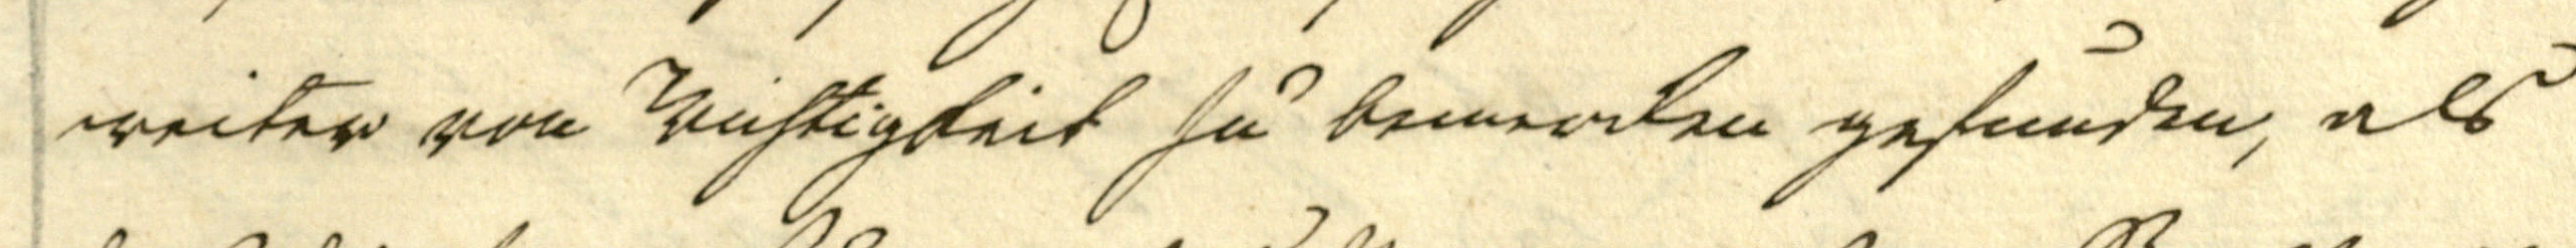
weiter von Wichtigkeit zu bemercken gefunden, als
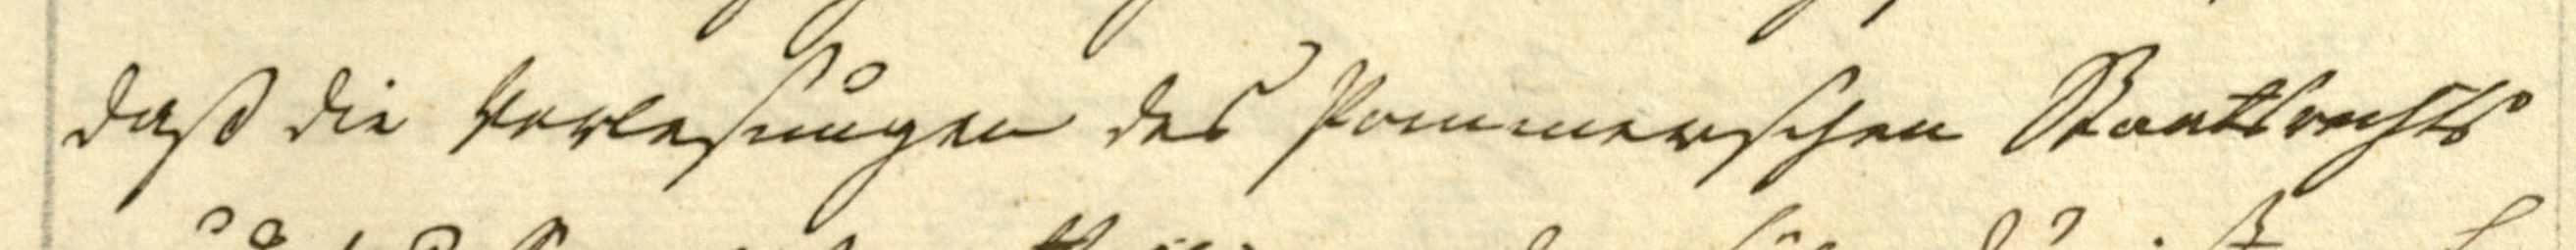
daß die Vorlesungen des Pommerschen Staatsrechts
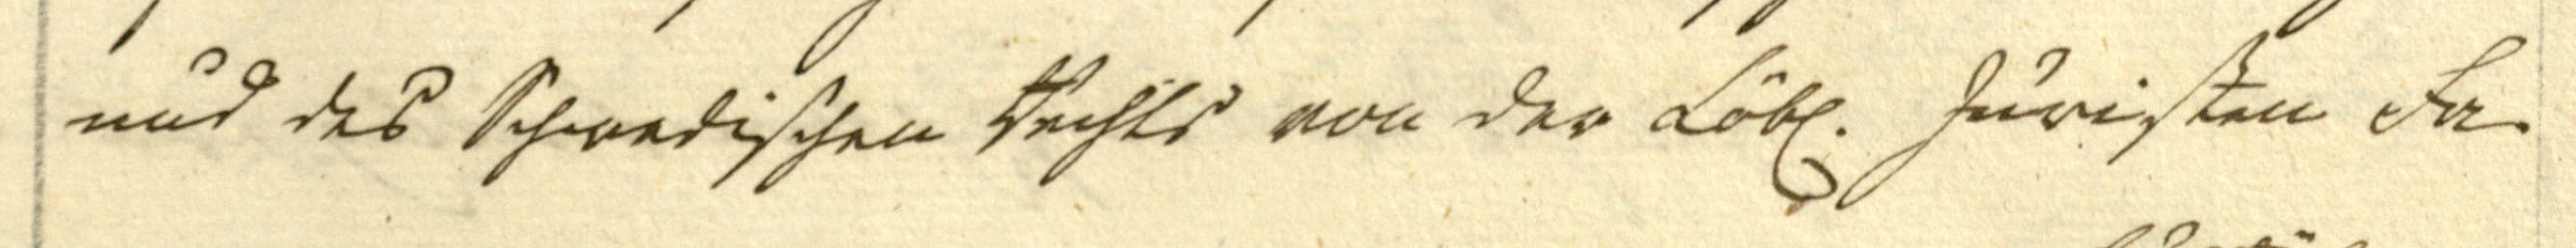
und des Schwedischen Rechts von der Löbl. Juristen Fa¬
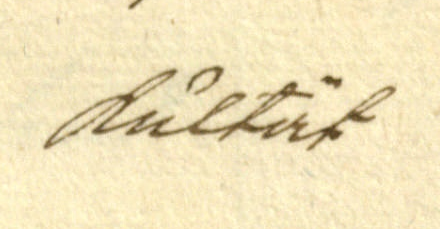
kultät
